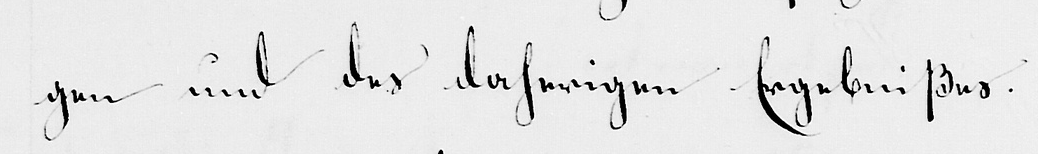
gen und des daherigen Ergebnißes.
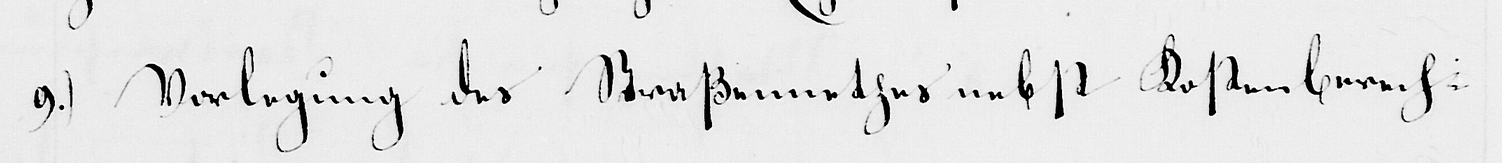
9.) Vorlegung des Straßennetzes nebst Kostenberech¬
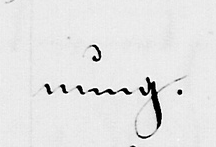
nung.
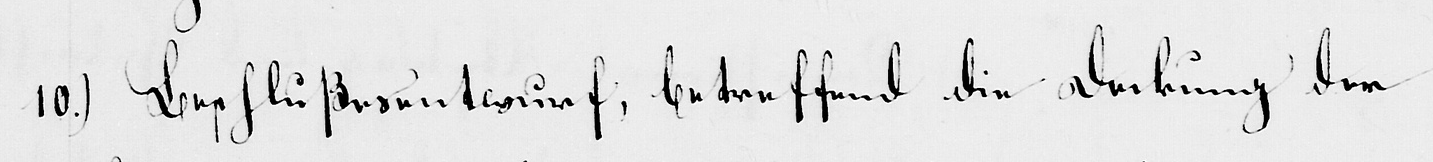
10.) Beschlußesentwurf, betreffend die Deckung der
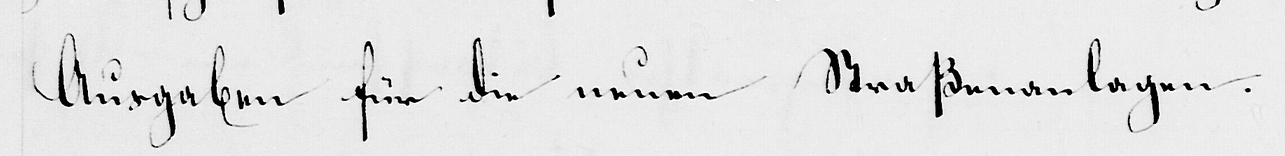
Ausgaben für die neuen Straßenanlagen.
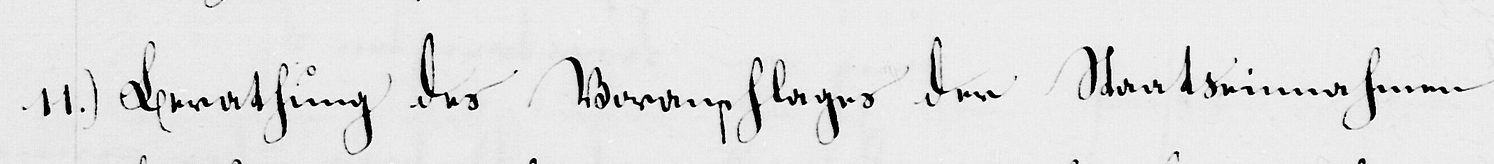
11.) Berathung des Voranschlages der Staatseinnahmen
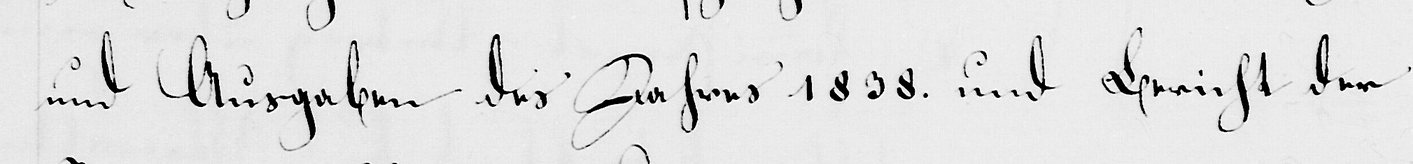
und Ausgaben des Jahres 1838. und Bericht der
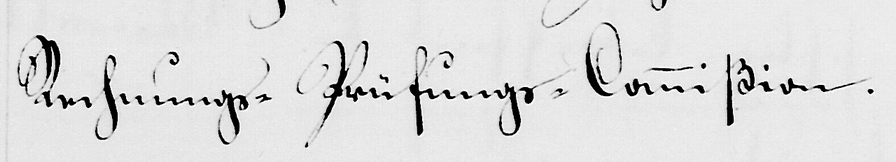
Rechnungs-Prüfungs-Commißion.
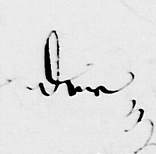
der
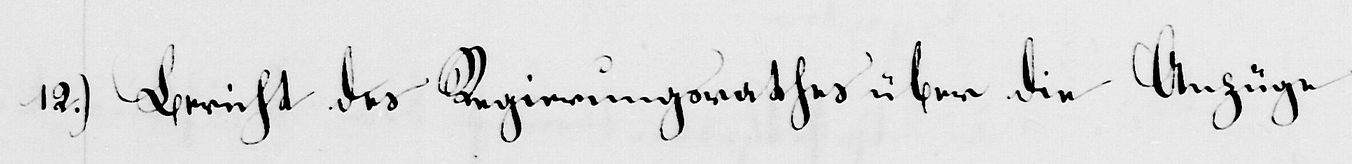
12.) Bericht des Regierungsrathes über die Anzüge
